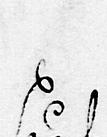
17.
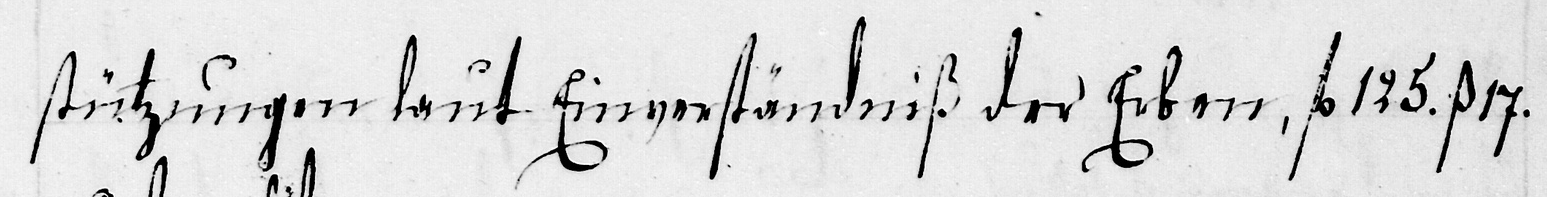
stützungen laut Einverständniß der Erben, fl. 125.
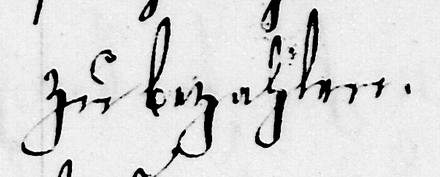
zu bezahlen.
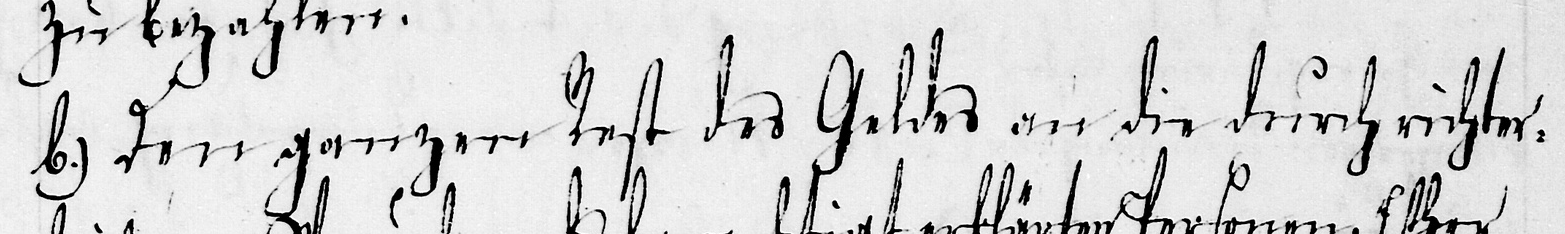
b.) Den ganzen Rest des Geldes an die durch richte¬
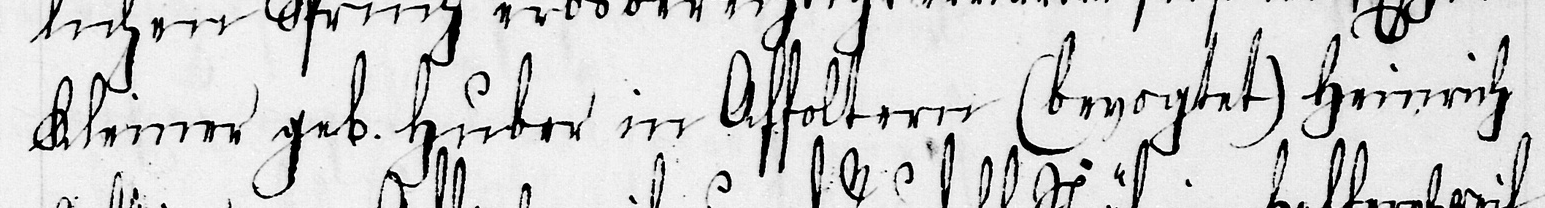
Kleiner geb. Huber in Affoltern (bevogtet) Heinrich
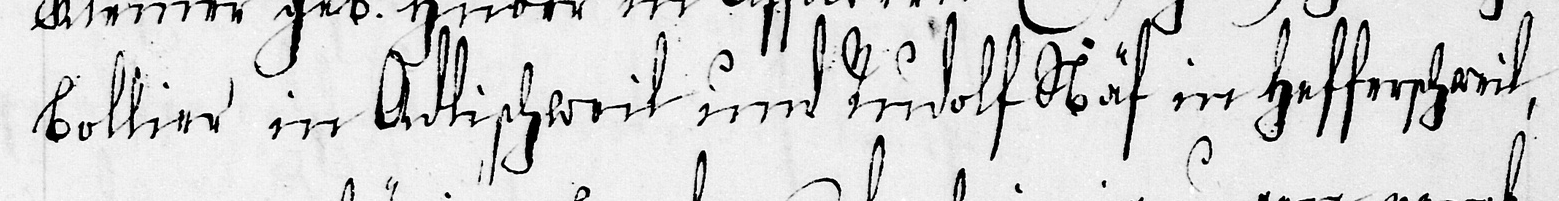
Bollier in Adlischweil und Rudolf Näf in Hefferschwei¬
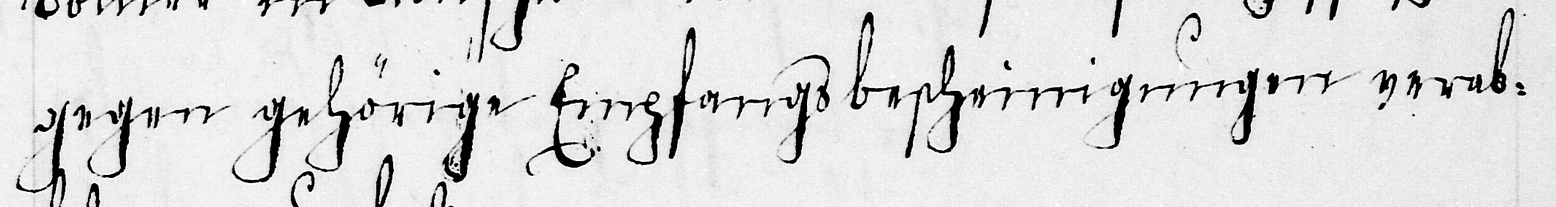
gegen gehörige Empfangsbescheinigungen verab¬
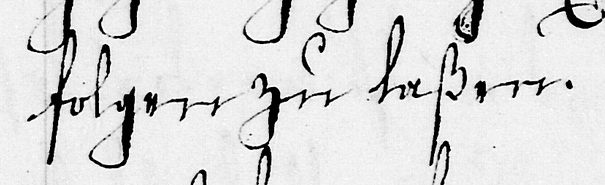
folgen zu laßen.
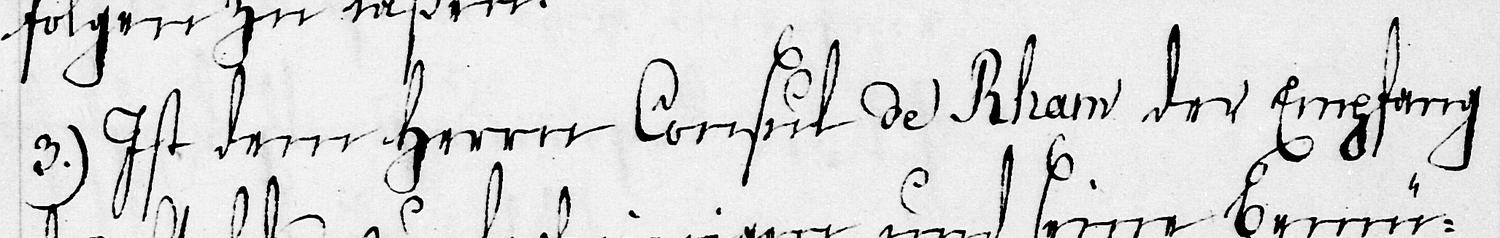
3.) Ist dem Herrn Consul de Rham der Empfang
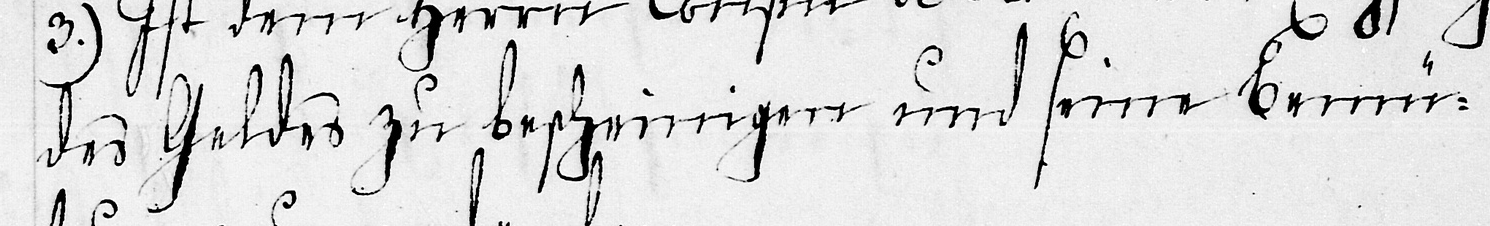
des Geldes zu bescheinigen und seine Bemü¬
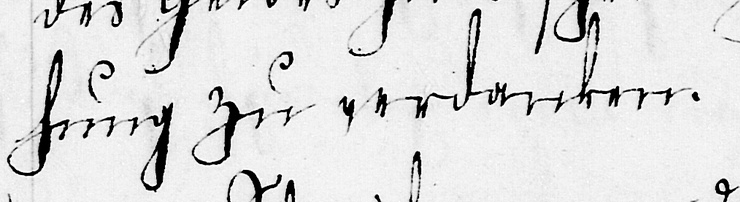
hung zu verdanken.
